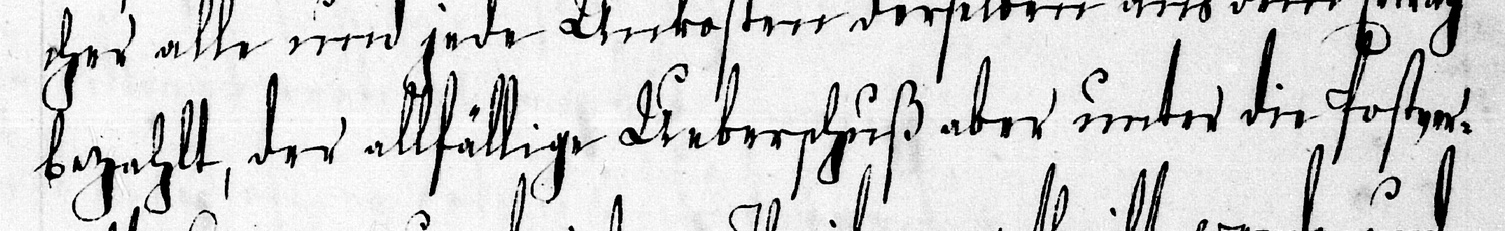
bezahlt, der allfällige Ueberschuß aber unter die Postve¬
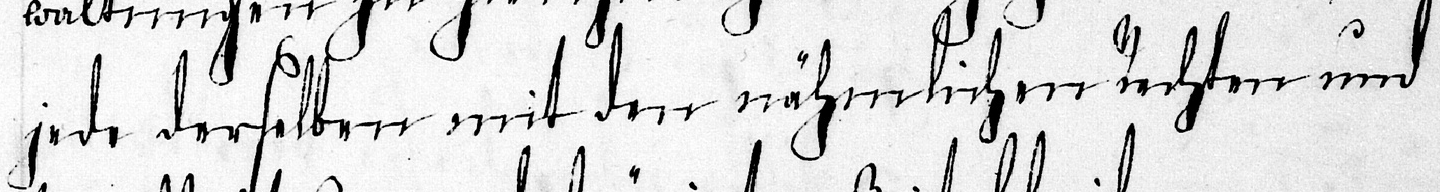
jeder derselben mit den nähmlichen Rechten und
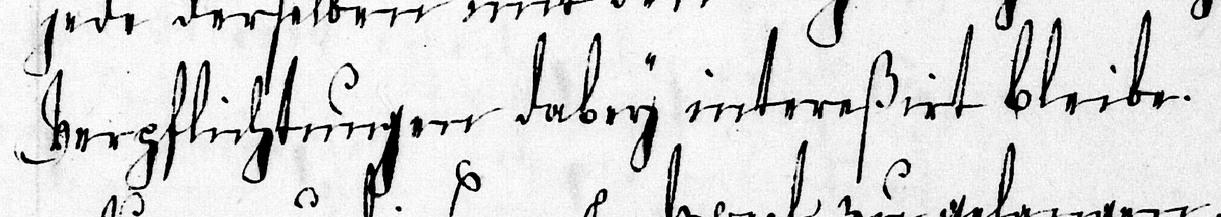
Verpflichtungen dabey intereßirt bleibe.
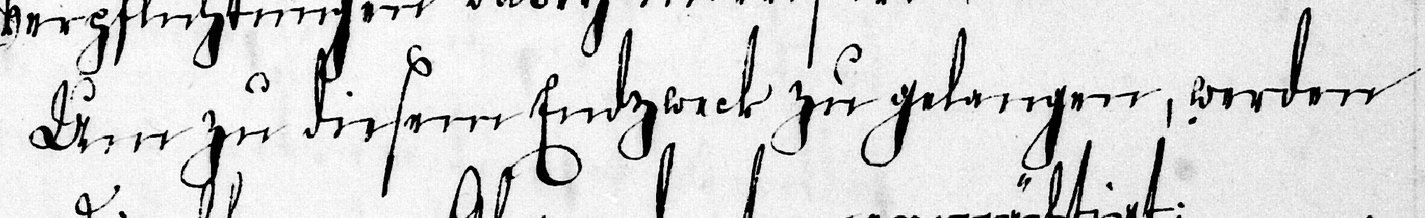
Um zu diesem Endzweck zu gelangen, werden
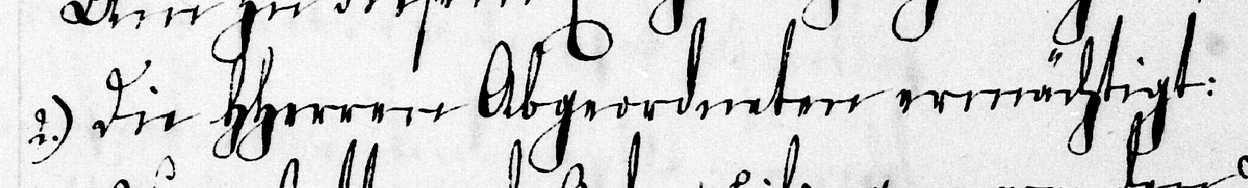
2.) Die HHerren Abgeordneten ermächtigt:
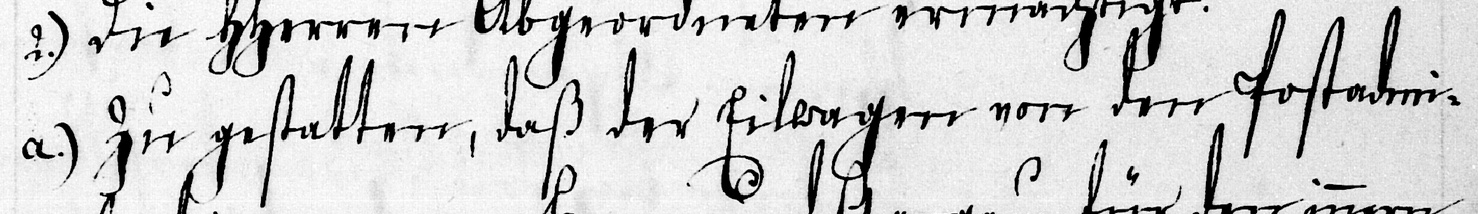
a.) Zu gestatten, daß der Eilwagen von den Postadmi¬
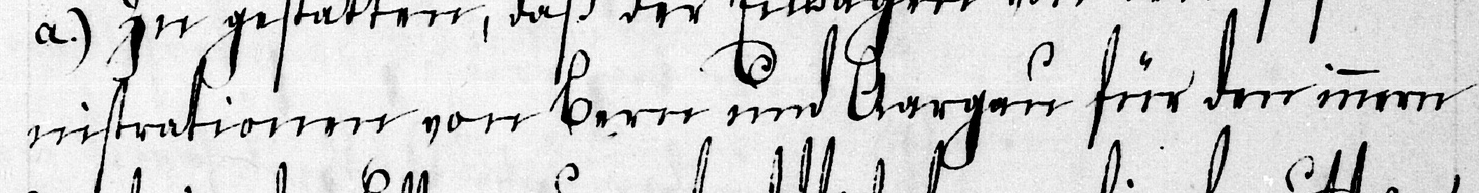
nistrationen von Bern und Aargau für den innern
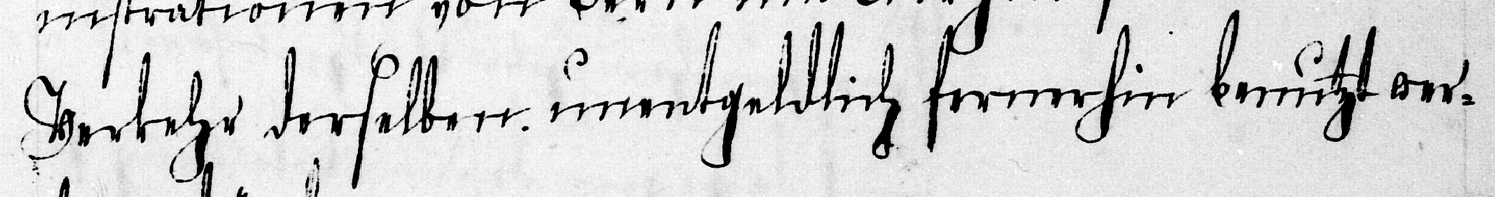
Verkehr derselben unentgeldlich fernerhin benutzt wer¬
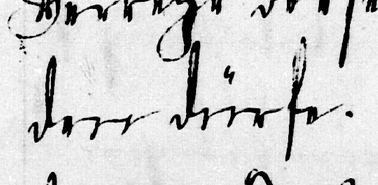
den dürfe.
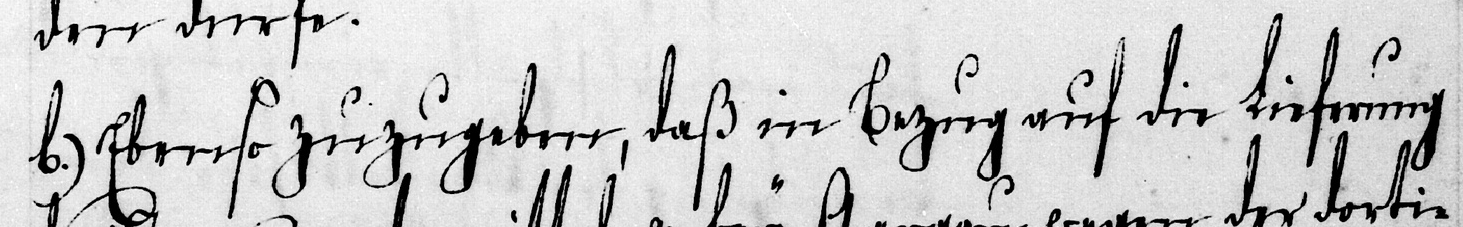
b.) Ebenso zuzugeben, daß in Bezug auf die Lieferung
